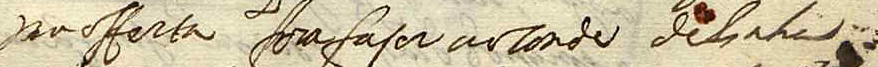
ma offerta fora fazer ao conde de Linha
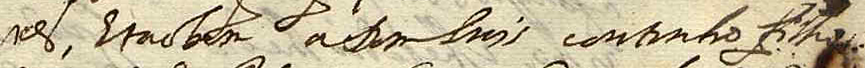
res, E taõbem a Dom luis coutinho filho
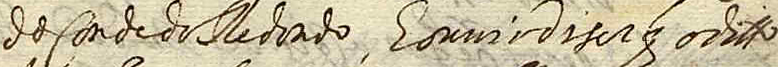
do Conde do Redondo, E ouuio diser q̄ o ditto
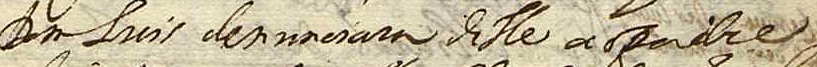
Dom Luis denunciara delle ao padre
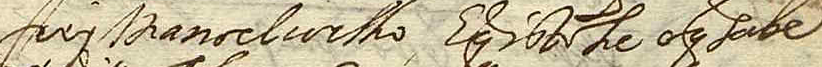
frey Manoel coelho, E q̄ isto he o q̄ sabe
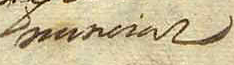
nunciar
